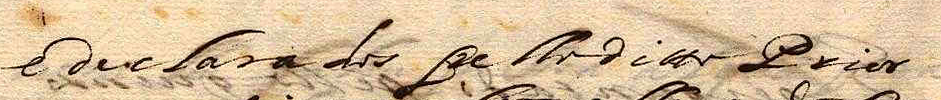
e declarados pello ditto Prior
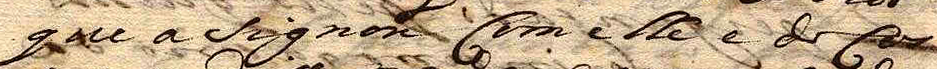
que asignou Com elle e do Cos
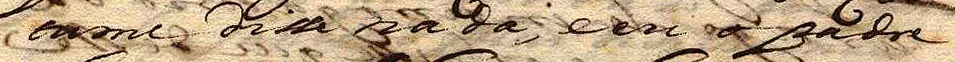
tume disse nada, e eu o padre
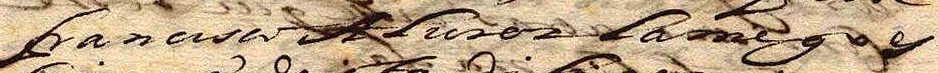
francisco Alurez Lamego es
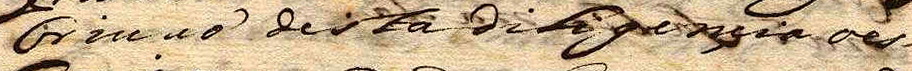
Criuaõ desta diligencia o es
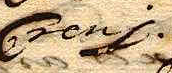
Creuj.
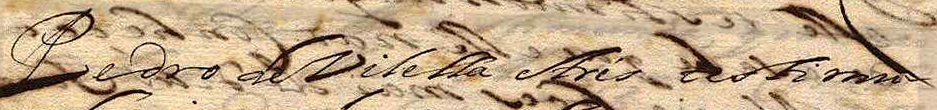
Pedro de Vilella Ares testimu
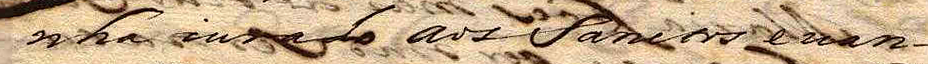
nha iurado aos Sanctos euan
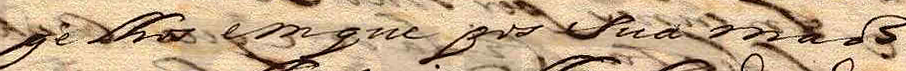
gelhos em que pos Sua maõ
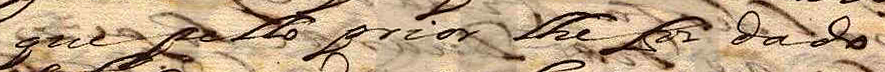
que pello prior lhe foi dado
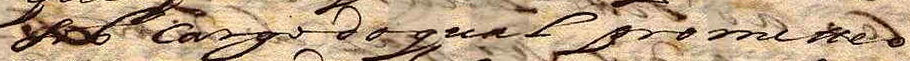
sob cargo do qual prometteo
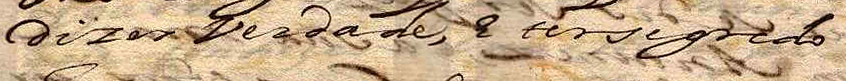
dizer verdade, e ter segredo
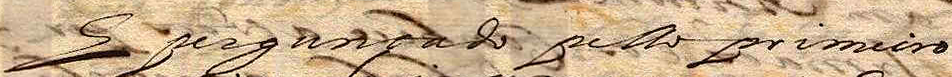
E perguntado pello primeiro
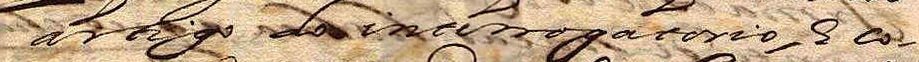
artigo do interrogatorio, E co
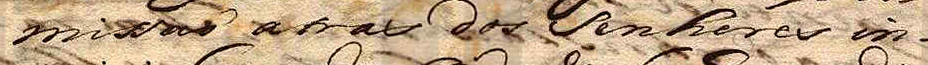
missaõ atras dos Senhores in
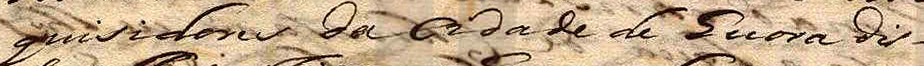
quisidores da Cidade de Euora dis
